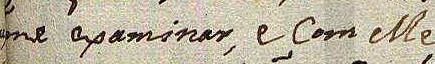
me examinar, e com elle
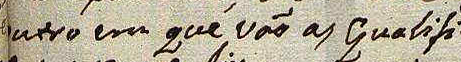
utro em que vaõ as qualifi
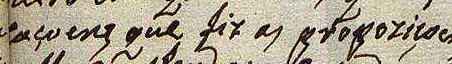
caçoens que fiz as propoziçoens
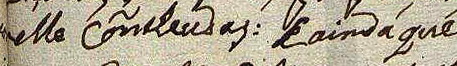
elle contheudas: E ainda que
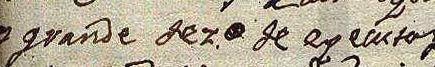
grande dez.o de executar
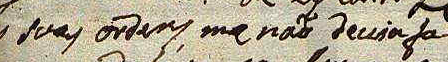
suas ordens me não deuia fa
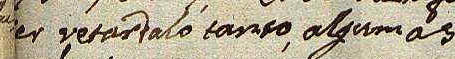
er retardalo tanto, algumas
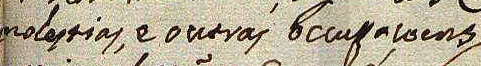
nolestias, e outras occupaçoens
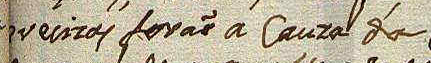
recizas foraõ a Cauza da
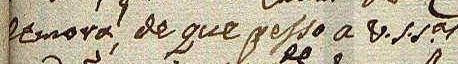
emora, de que pesso a v. s.s.as
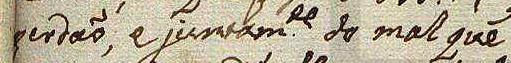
perdaõ, e juntam.te do mal que
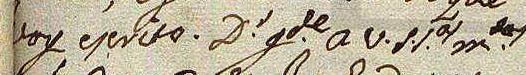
ay escrito. D.s gd.e a v. s.s.as m.tos
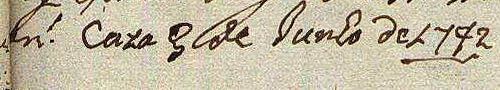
an.s Caza 3 de Iunho de 1742
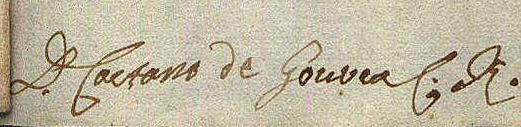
D. Caetano de Gouvea C. R.
